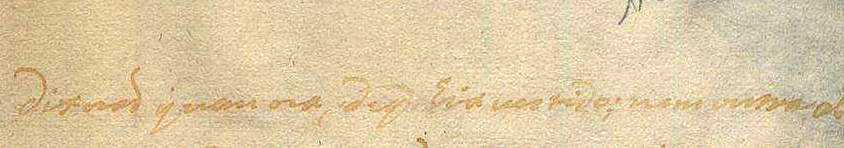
diseraõ quem era, de q̄ hia uestido, nem outra al
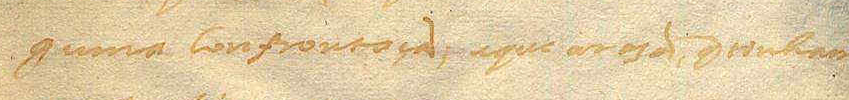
guma confrontaçaõ, e que a rezaõ, q̄ tinham
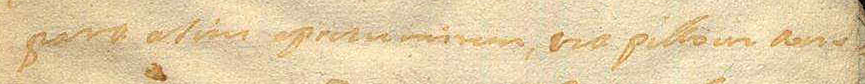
para asim o prezumirem, era pello encon
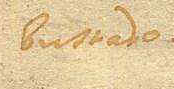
bustado.
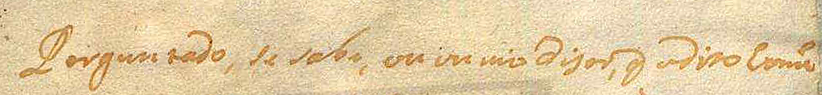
Perguntado, se sabe, ou ouuio dizer, q̄ o dito homē
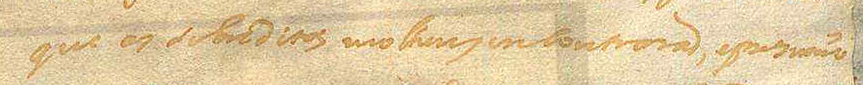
que as sobreditas molheres encontraraõ, e presumē
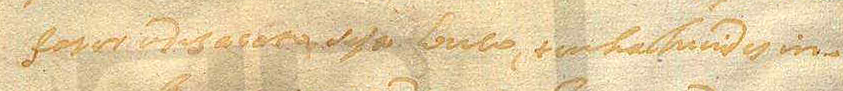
faser o dezacato seja louco, tenha lucidos in
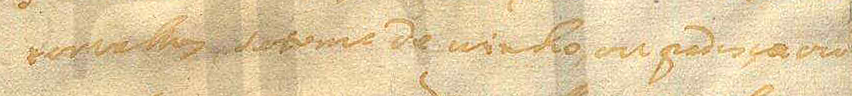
tervallos se tome de uinho, ou padesça ou
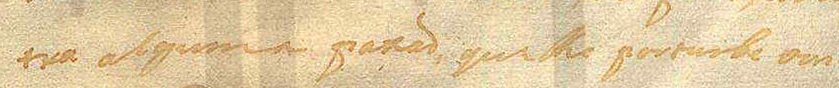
tra alguma paxaõ, que lhe perturbe o en
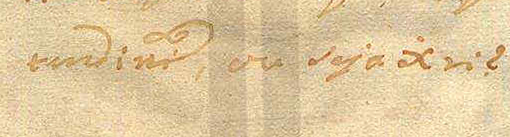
tendim.to, ou seja xn?
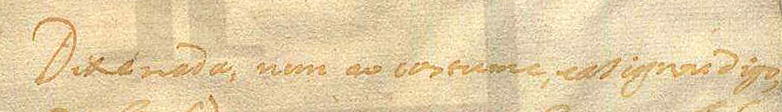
Dixe nada, nem ao costume, e asignou digo,
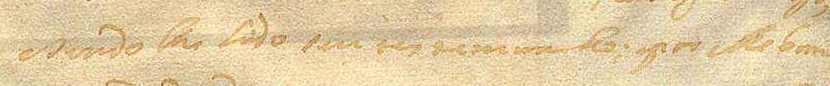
e sendo lhe lido seu testemunho; por elle bem
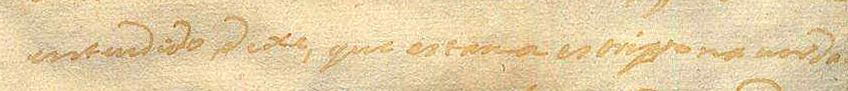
entendido dixe, que estaua escripto na uerda
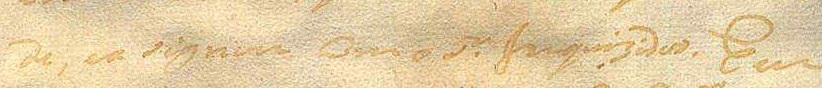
de, e asignou com o s.r Jnquizidor. E eu
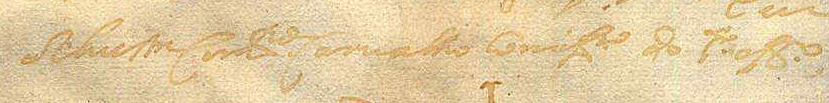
Siluestre Cord.ro Carualho Comiss.ro do s.to off.o,
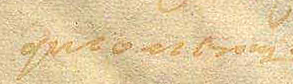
que o escreuj.
